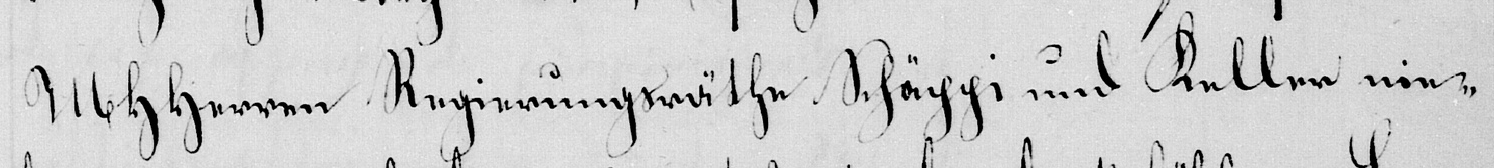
MHHerren Regierungsräthe Schäppi und Keller nie¬
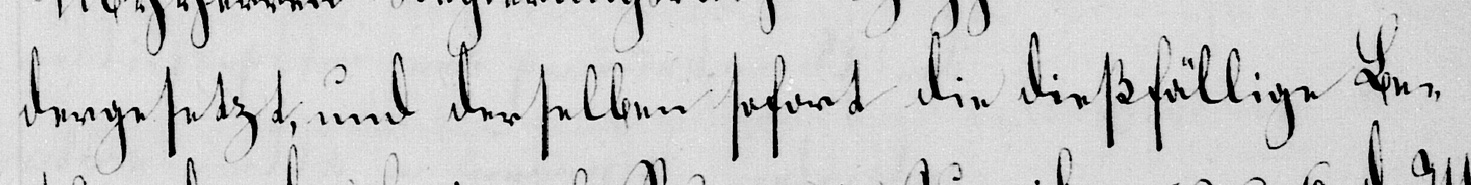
dergesetzt, und derselben sofort die dießfällige Be¬
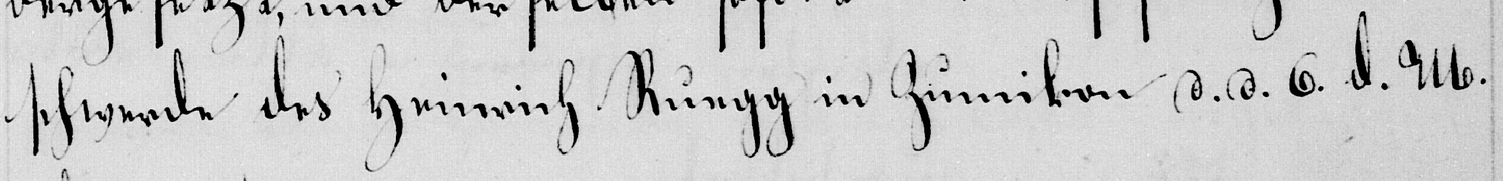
schwerde des Heinrich Ruegg in Zumikon d. d. 6. d. M.
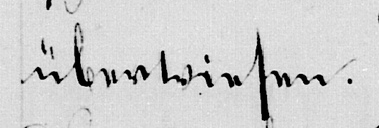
überwiesen.
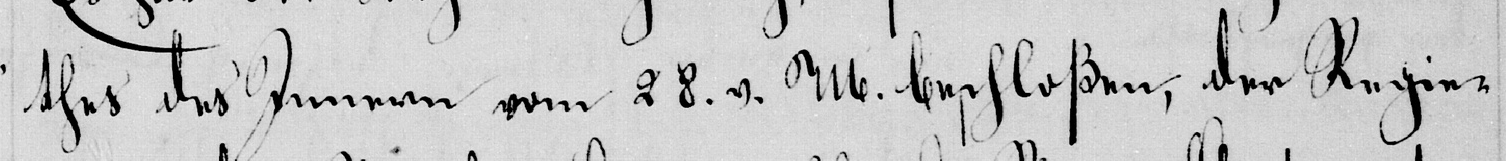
thes des Innern vom 28. v. M. beschloßen, der Regie¬
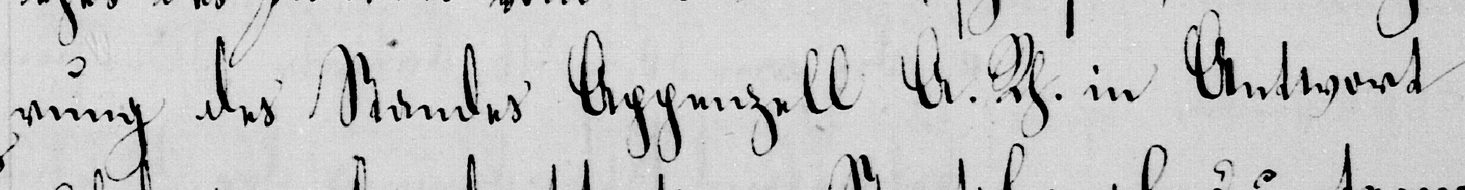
rung des Standes Appenzell A. Rh. in Antwort
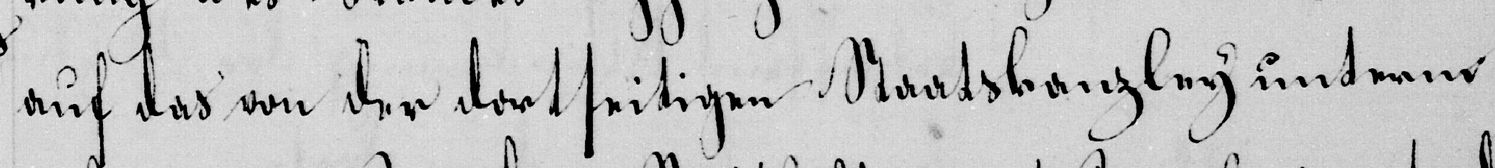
auf das von der dortseitigen Staatskanzley unterm
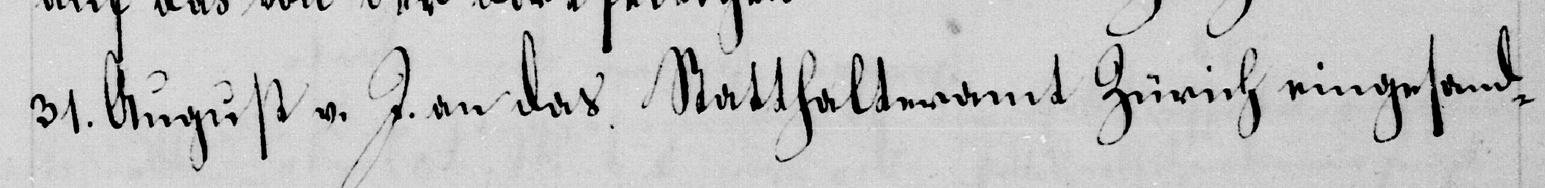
31. August v. J. an das Statthalteramt Zürich eingesand-
